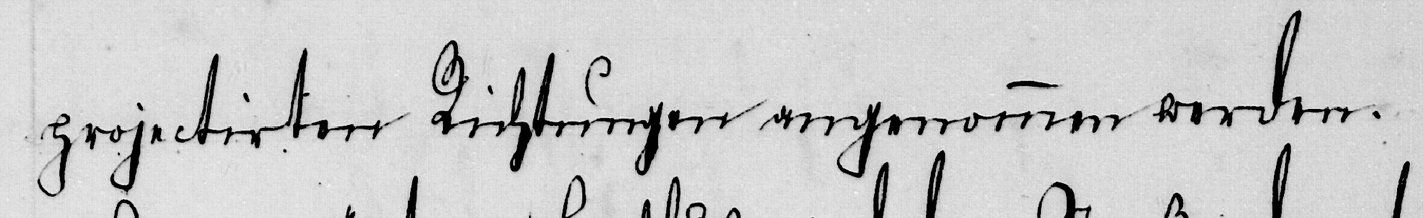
projectirten Richtungen angenommen werden.
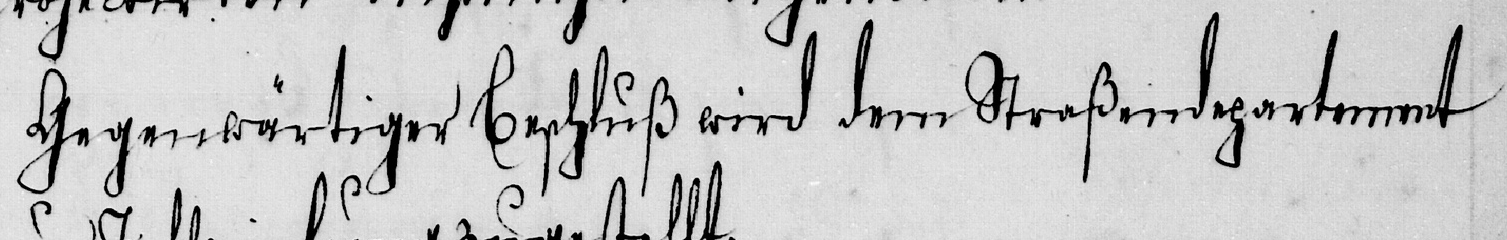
Gegenwärtiger Beschluß wird dem Straßendepartement
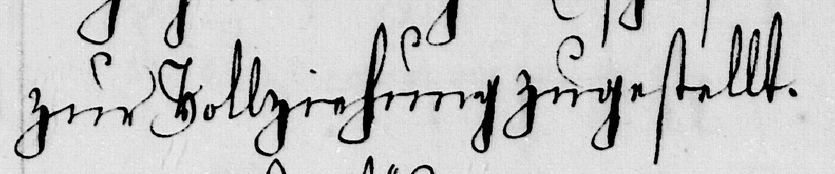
zur Vollziehung zugestellt.
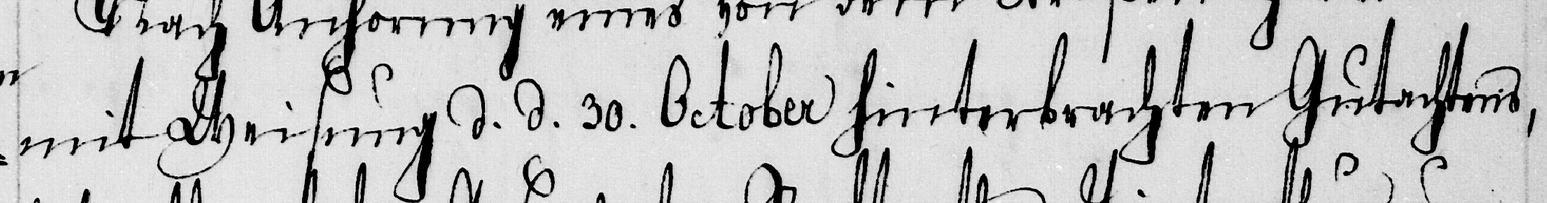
mit Weisung d. d. 30. October hinterbrachten Gutachtens,
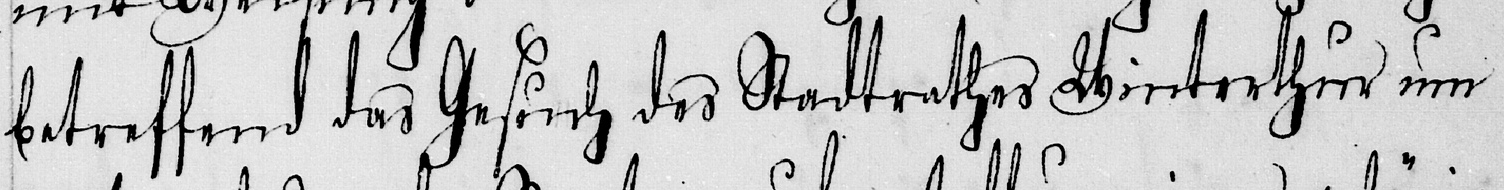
betreffend das Gesuch des Stadtrathes Winterthur um
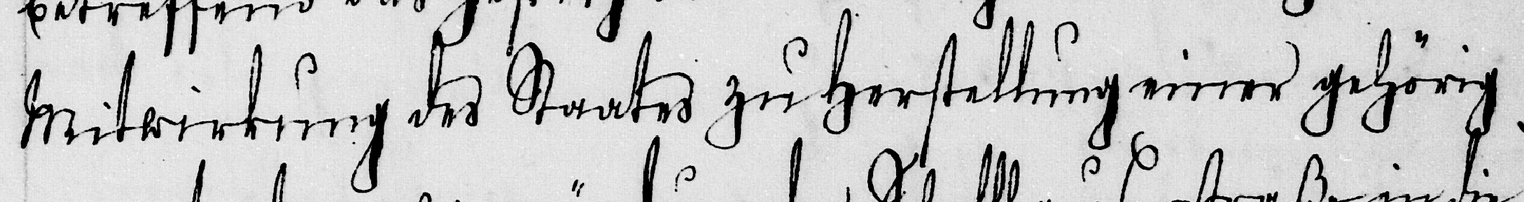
Mitwirkung des Staates zu Herstellung einer gehörig
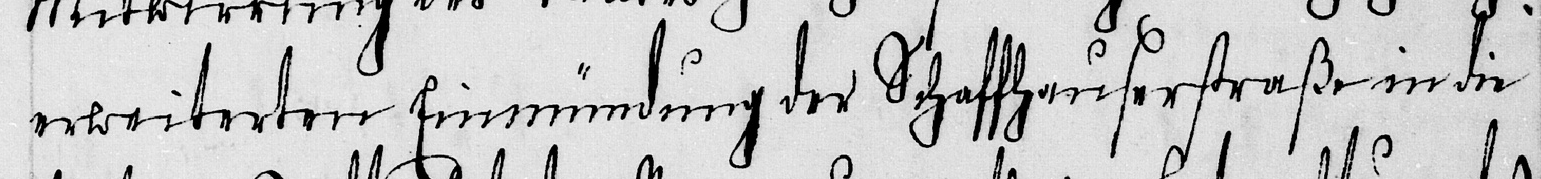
erweiterten Einmündung der Schaffhauserstraße in die
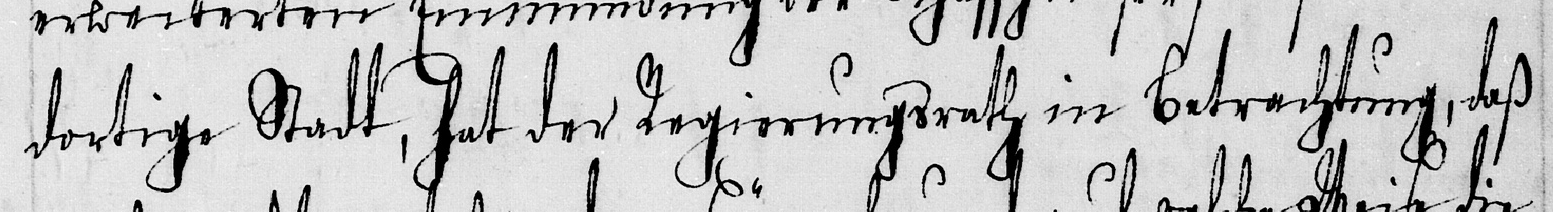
dortige Stadt, hat der Regierungsrath in Betrachtung, daß
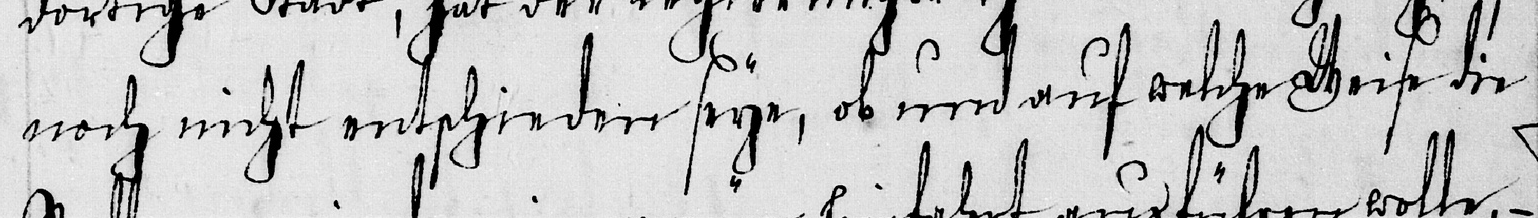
noch nicht entschieden seye, ob und auf welche Weise die
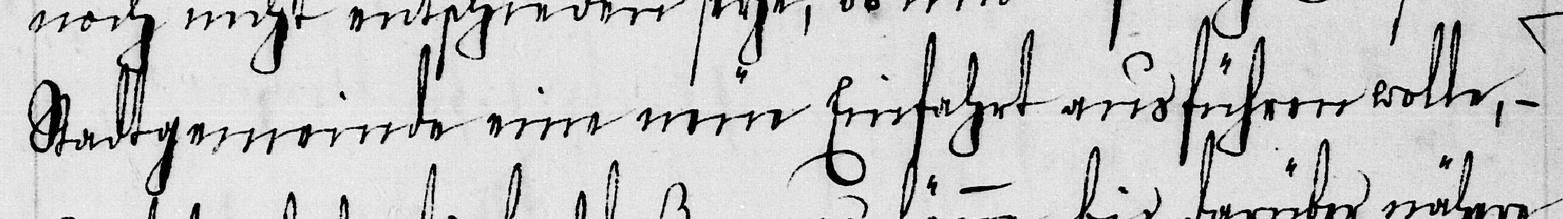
Stadtgemeinde eine neue Einfahrt ausführen wolle, –
